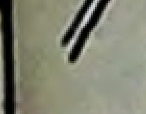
4
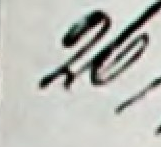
26
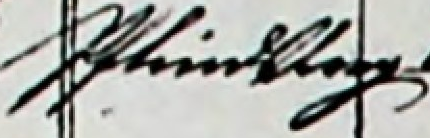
Pflindsberg
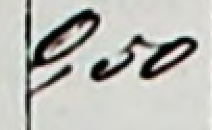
0,50
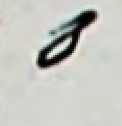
8
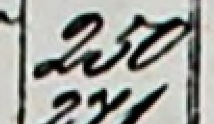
250
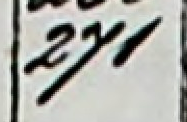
271
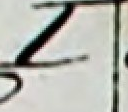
I
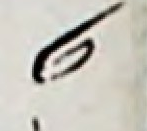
6
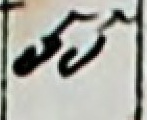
55
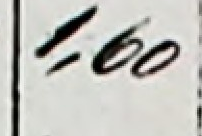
1,60
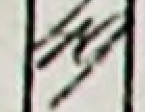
49
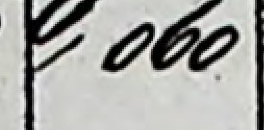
0,060
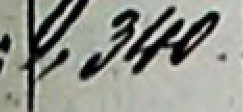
0,340
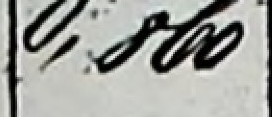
0,860
